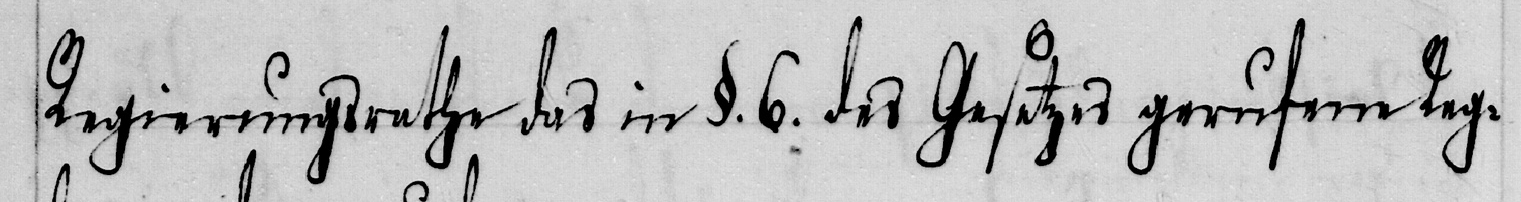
Regierungsrathe das in §. 6. des Gesetzes gerufene Reg¬
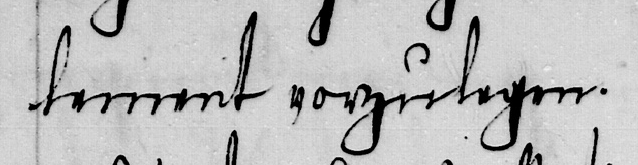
lement vorzulegen.
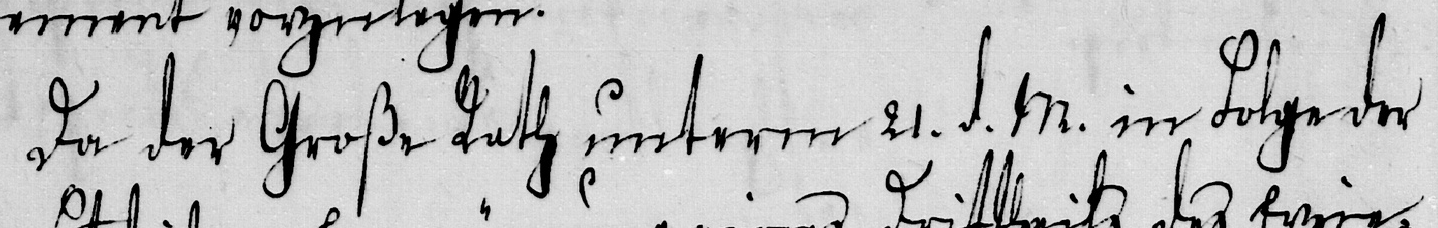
Da der Große Rath unterm 21. d. M. in Folge der
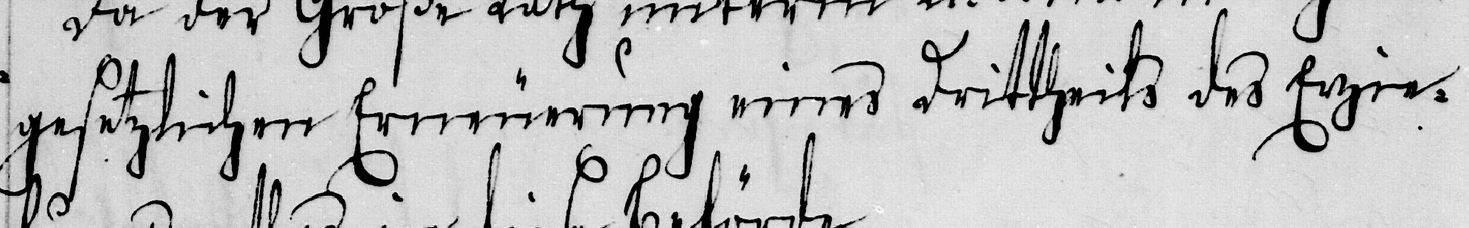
gesetzlichen Erneuerung eines Drittheils des Erzie¬
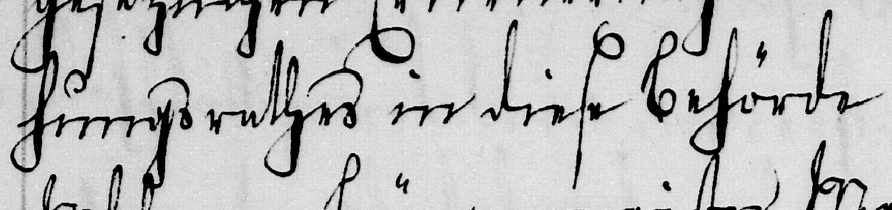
hungsrathes in diese Behörde
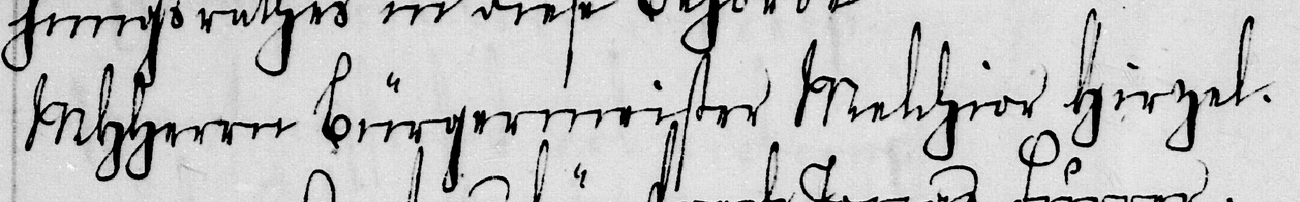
MHHerrn Bürgermeister Melchior Hirzel.
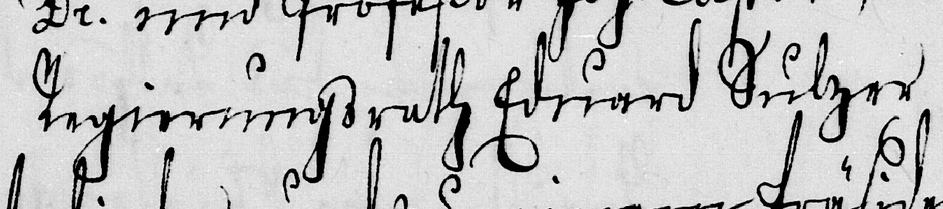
egierungsrath Eduard Sulzer.
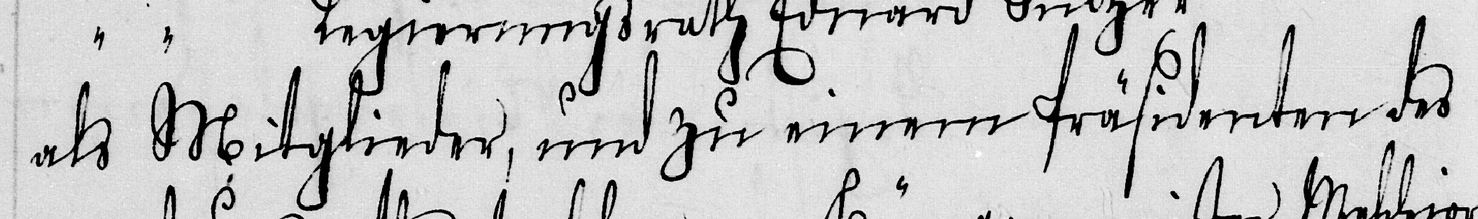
als Mitglieder, und zu einem Präsidenten des
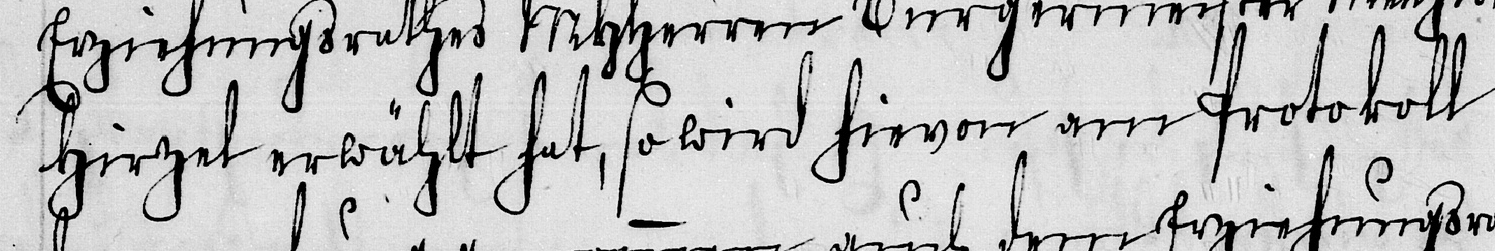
Hirzel erwählt hat, so wird hievon am Protokoll
